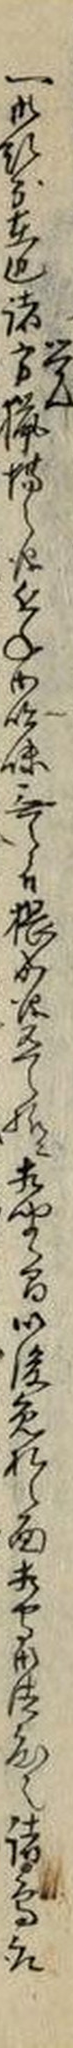一御領分在辺諸方猟場之儀近年御吟味無之ニ付猥成儀有之様ニ相聞候間以後免札之面相守御法度之諸鳥取
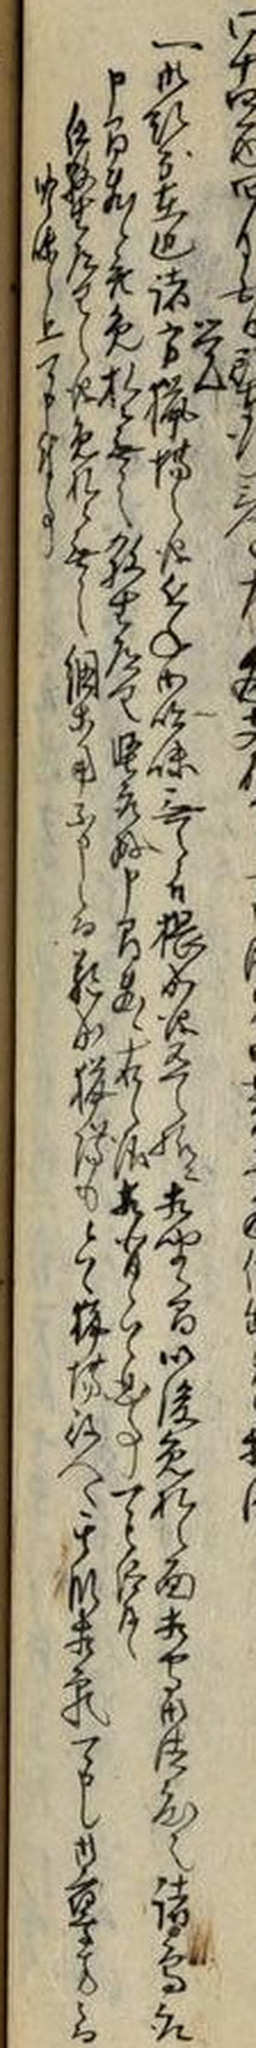申間敷候幷免札ニ無之殺生道具堅取扱申間敷候右之趣相背候ハヽ曲事可被仰付候
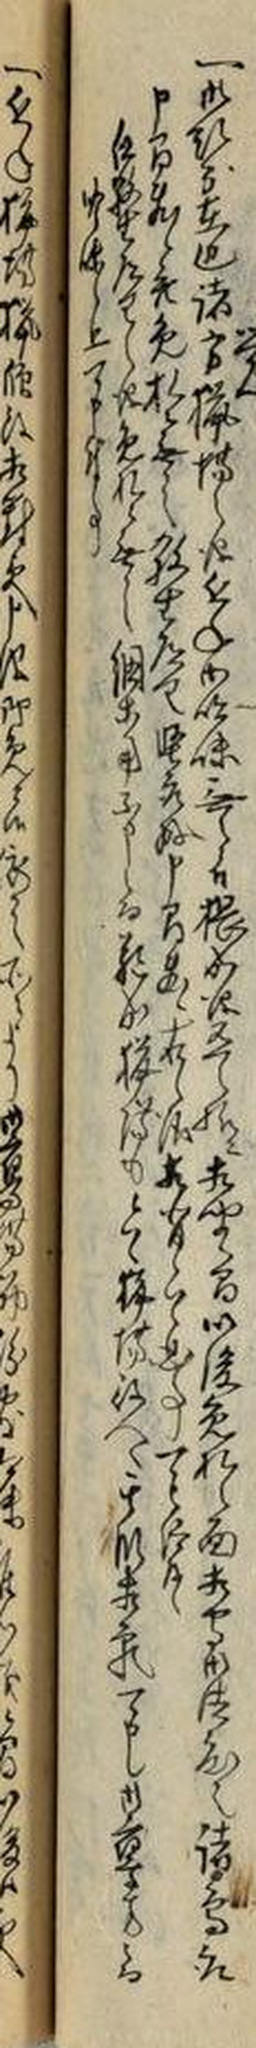但殺生道具之儀免札ニ無之網等用不申候而難成猟場も候ハヽ猟場役人へ其段相願可申候御鷹方ニ而
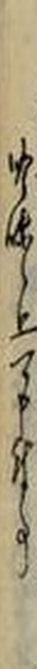吟味之上可申付事
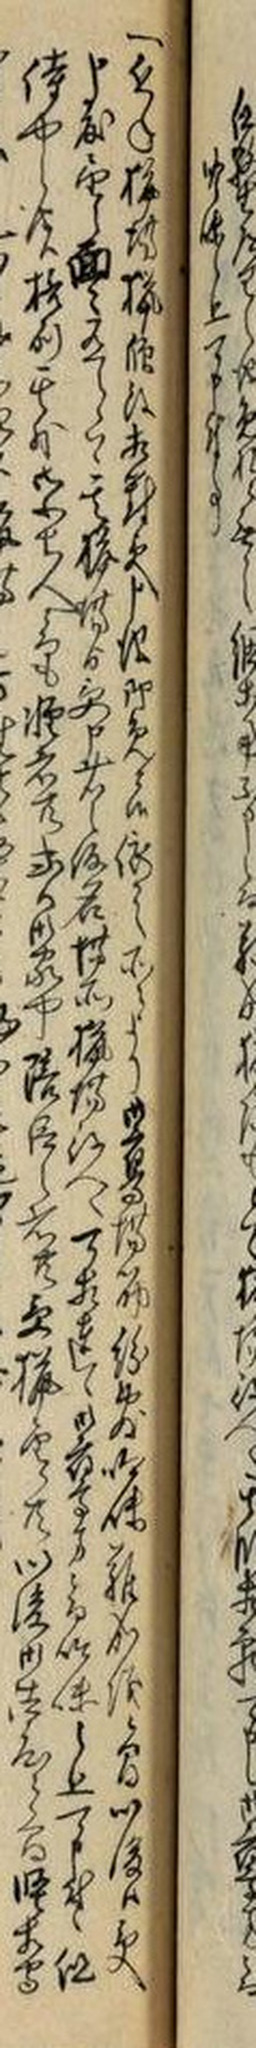一近年猟場猟師致相対受申儀御免ニ候依之所ニより御鷹場筋紛敷吟味難成儀候間以後ハ受
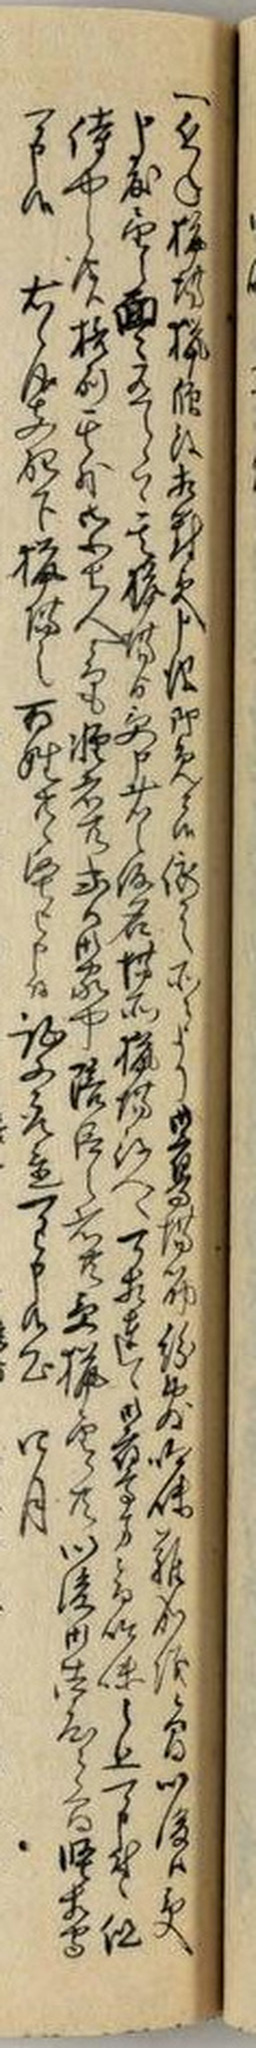申度届之面々有之候ハヽ其猟場ゟ受申者之仮名場所猟場役人へ可相達候御鷹方ニ而吟味之上可申付候但
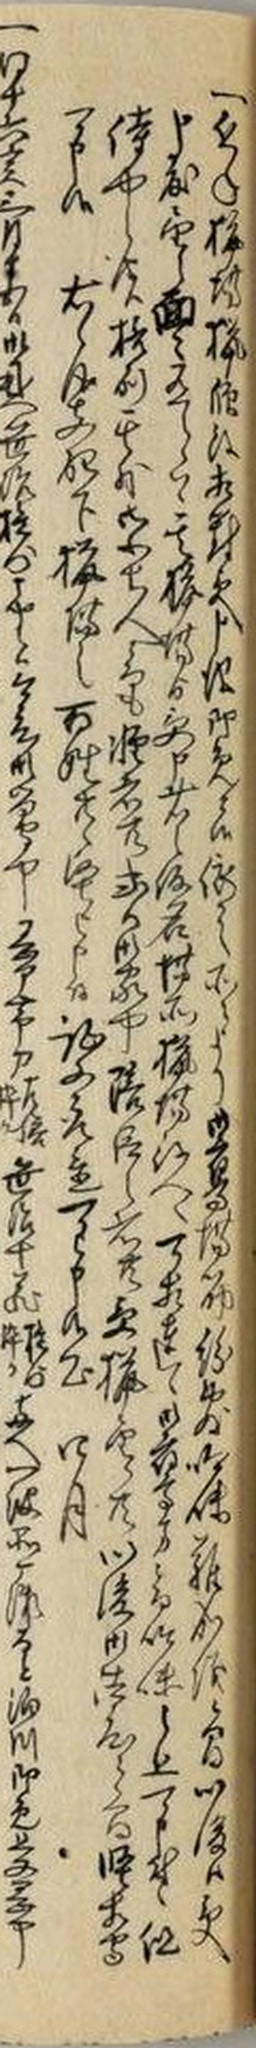侍中之儀ハ格別其外御ふち人ニ而も軽者共或ハ御家中陪臣之者共受猟届候共以後御法度ニ候間堅相守
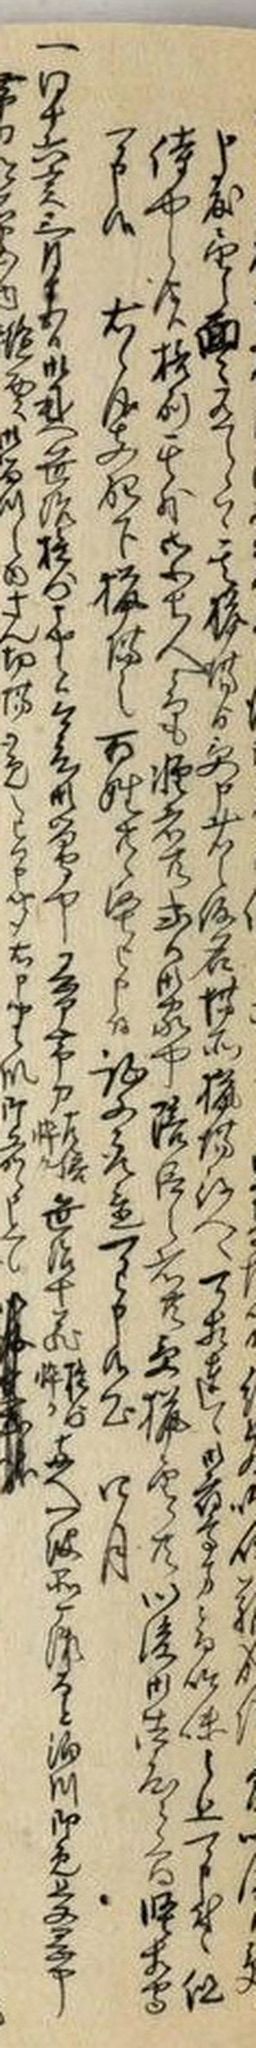可申候右之儀支配下猟場之百姓共へ堅被申付証文取置可被申候已上四月
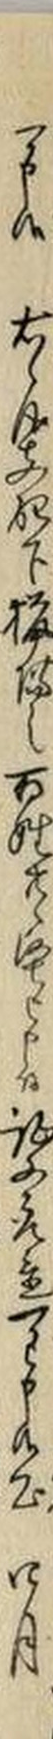可申候右之儀支配下猟場之百姓共へ堅被申付証文取置可被申候已上四月
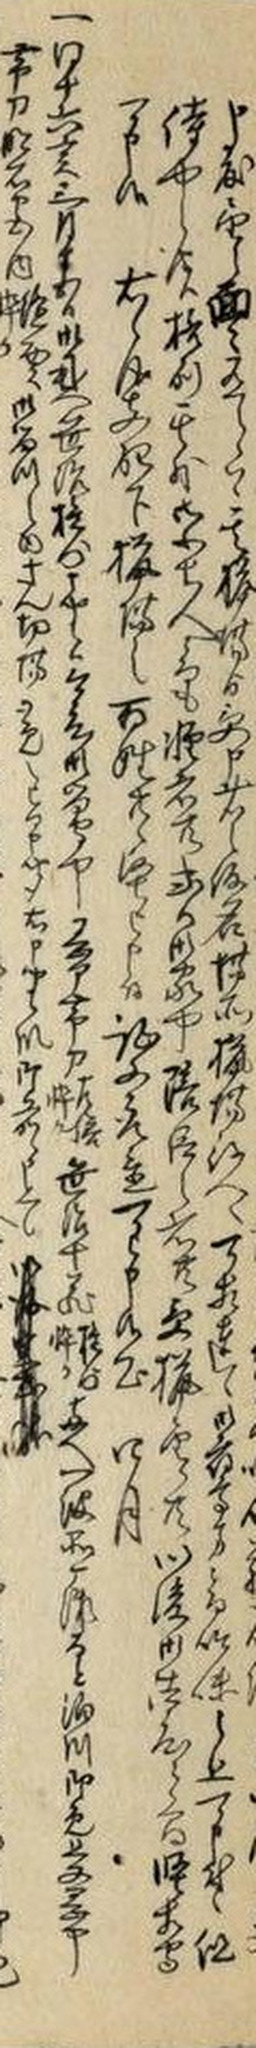可申候右之儀支配下猟場之百姓共へ堅被申付証文取置可被申候已上四月
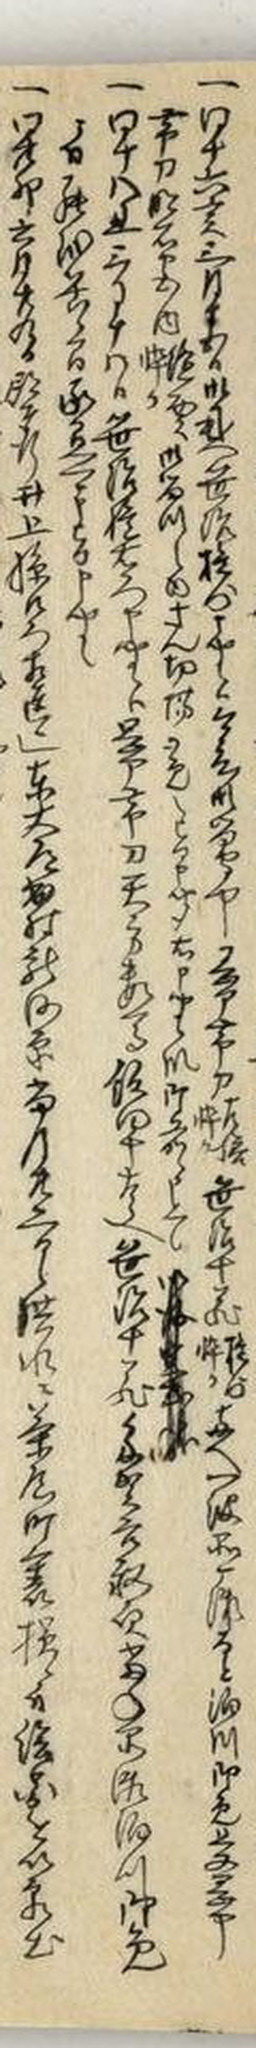一同十八丑三月十八日笹治権右衛門申聞候ハ岡部帯刀天方数馬飯田十太夫笹治十蔵多賀谷靱負当年品瀬泊川御免
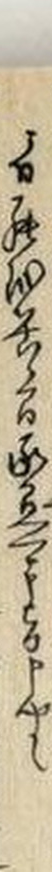ニ付罷越筈候間承置可申旨申聞候
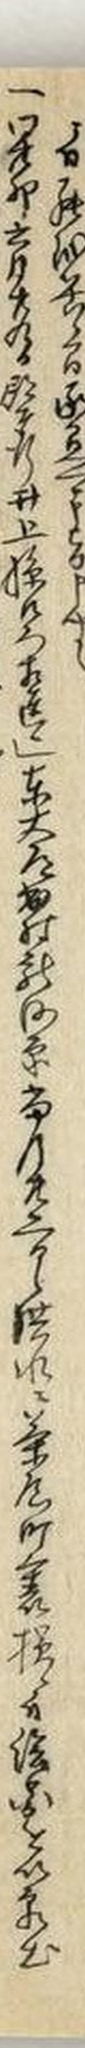一同廿卯六月廿九日郡奉行井上孫左衛門相達候」東大道出村新河原当月廿二日洪水ニ茶屋町裏損候ニ付絵図を以願出
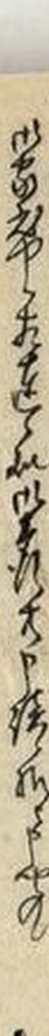御家老中へ相達候処御奉行共申談候様被申聞候
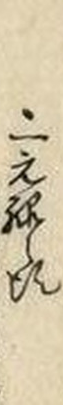一元禄之頃
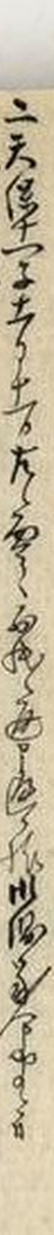・一天保十一子十一月十一日左之面々へ別紙之通申通候様御側御用人申聞候ニ付
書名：御国他国諸事之部
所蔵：福井県文書館 Fukui Prefectural Archives
